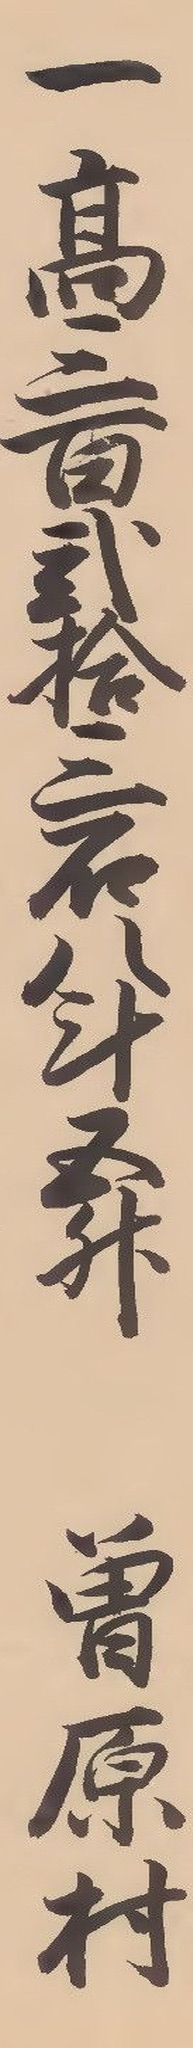一髙三百弐拾三石八斗五升曽原村
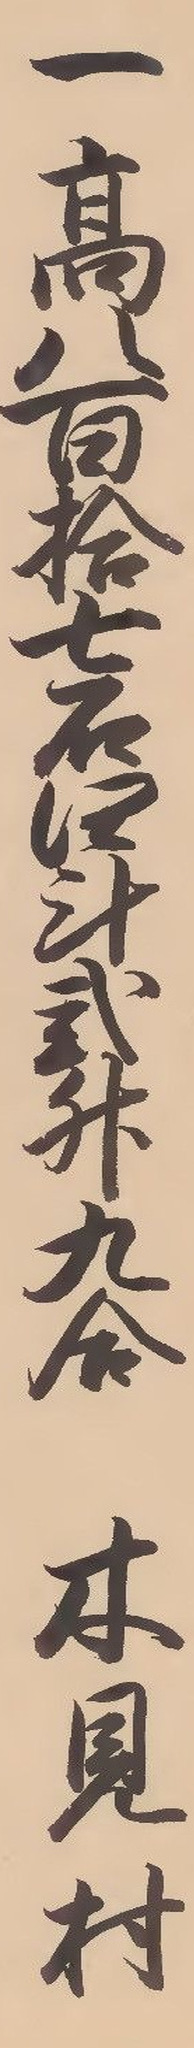一髙八百拾七石四斗弐升九合木見村
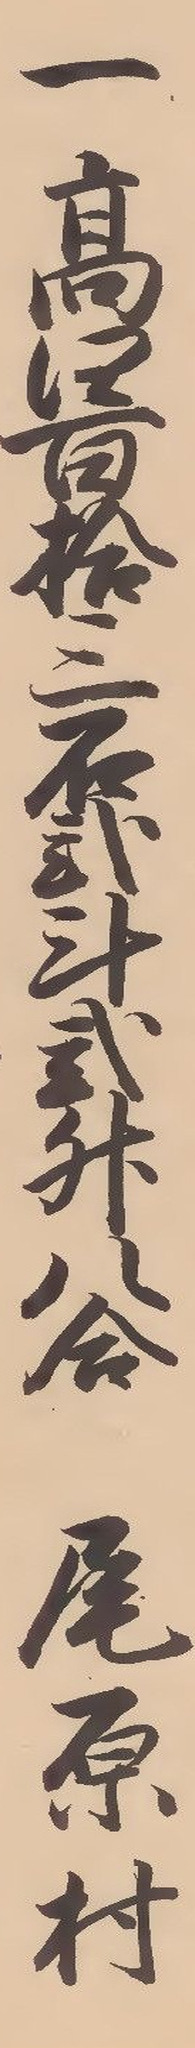一髙四百拾三石弐斗弐升八合尾原村

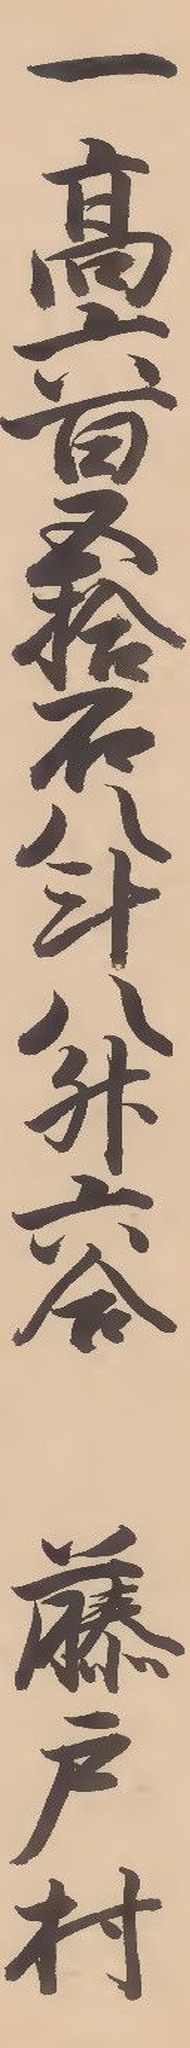一髙六百五拾石八斗八升六合藤戸村
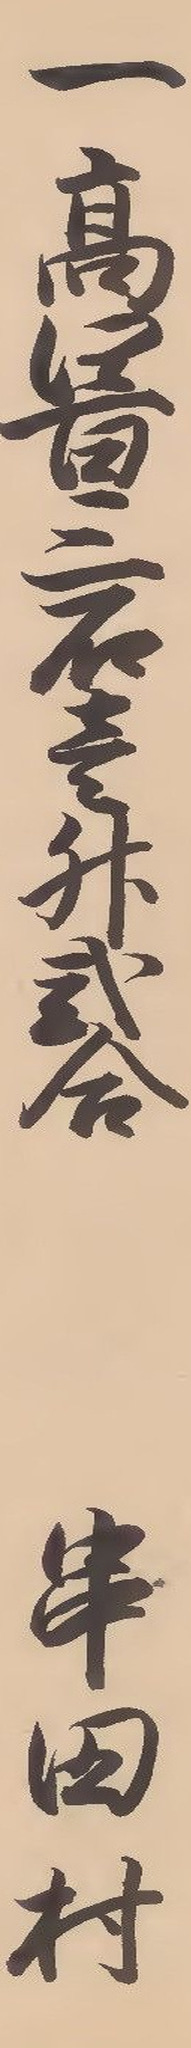一髙四百三石壱升弐合串田村
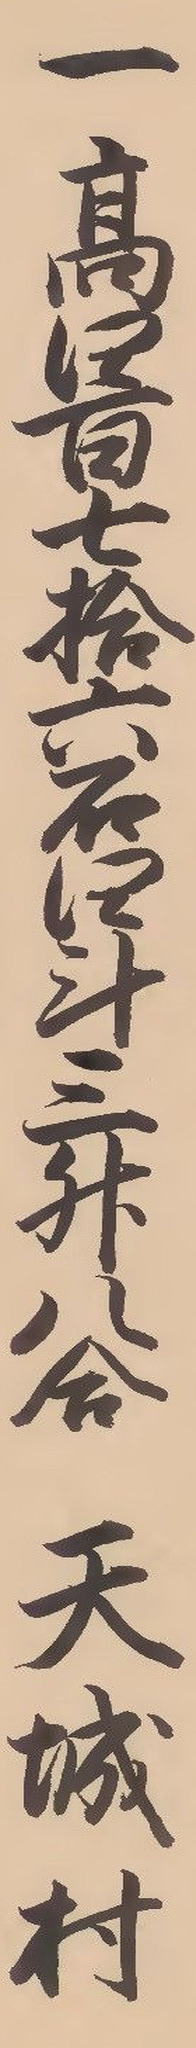一髙四百七拾六石四斗三升八合天城村
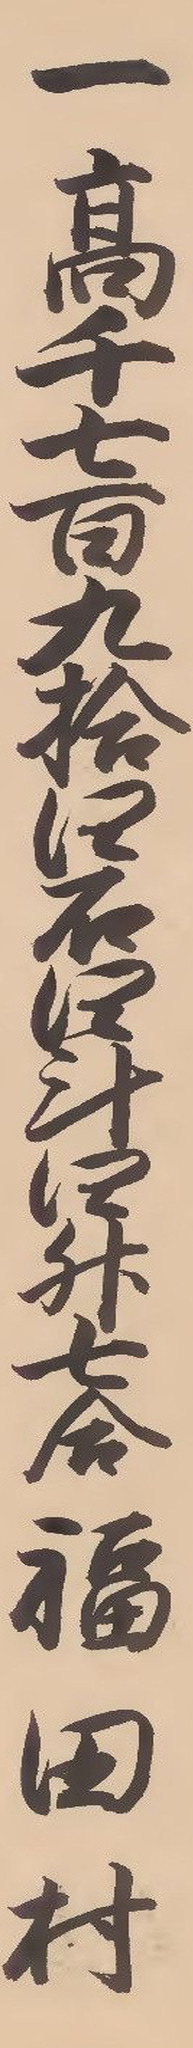一髙千七百九拾四石四斗四升七合福田村
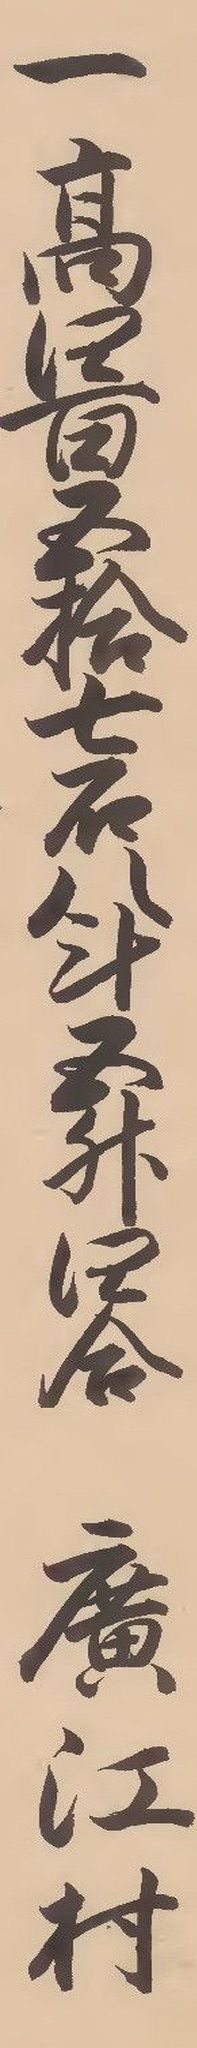一髙四百五拾七石八斗五升四合廣江村
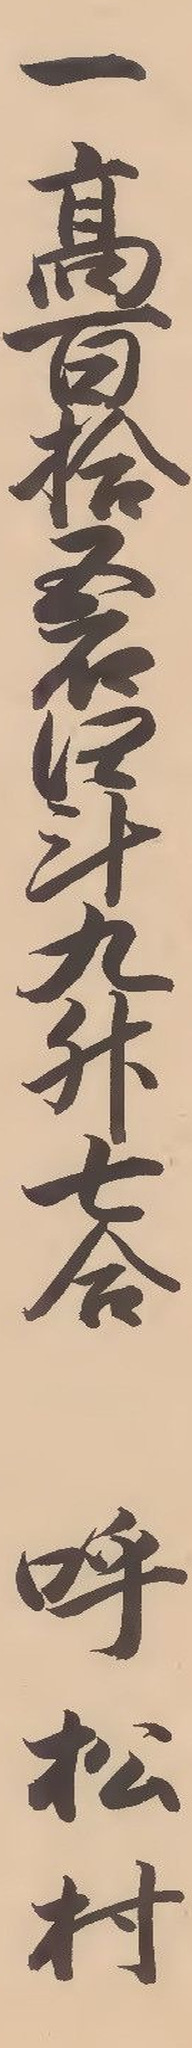一髙百拾五石四斗九升七合呼松村
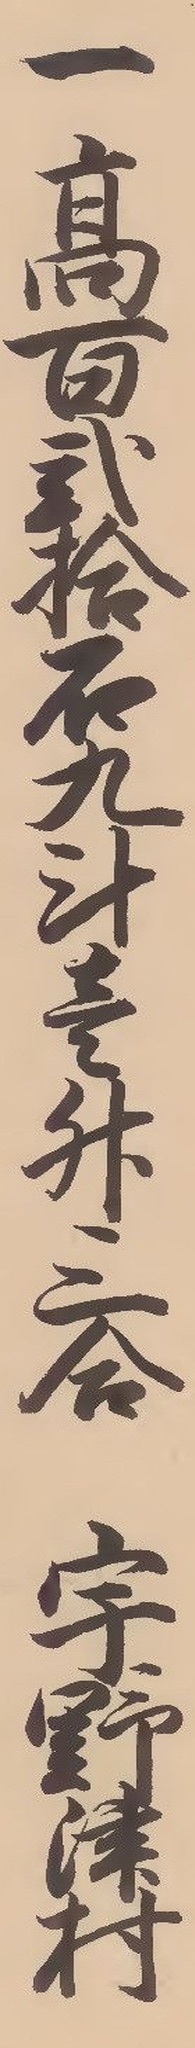一髙百弐拾石九斗壱升三合宇野津村
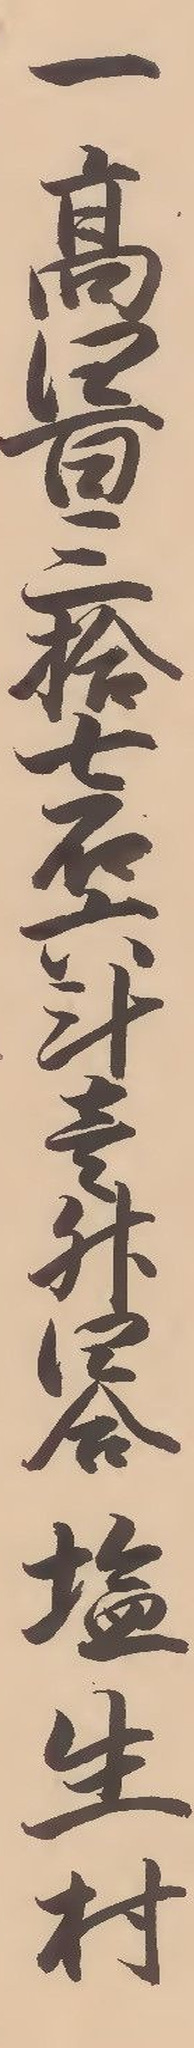一髙四百三拾七石六斗壱升四合塩生村

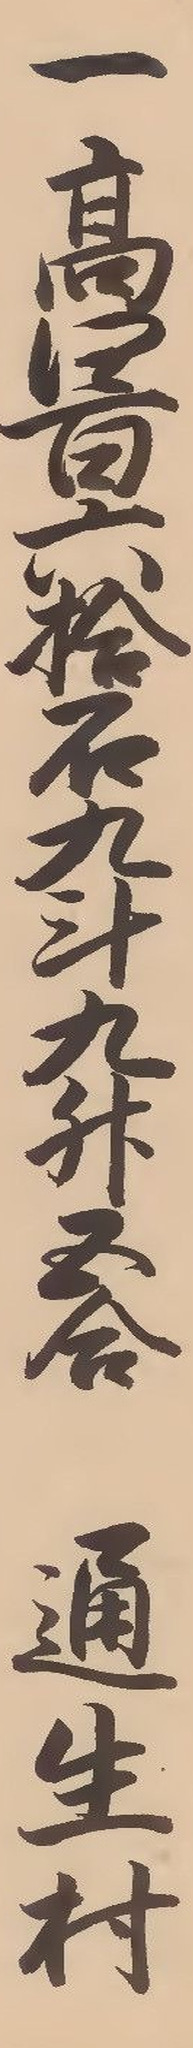一髙四百六拾石九斗九升五合通生村
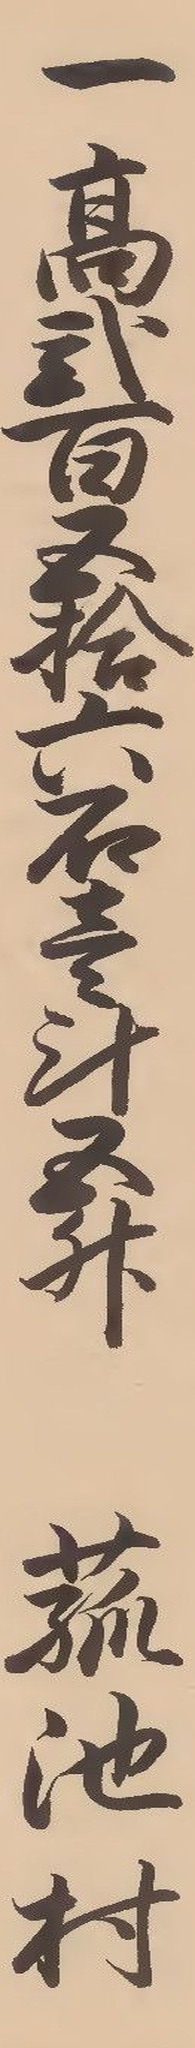一髙弐百五拾六石壱斗五升菰池村
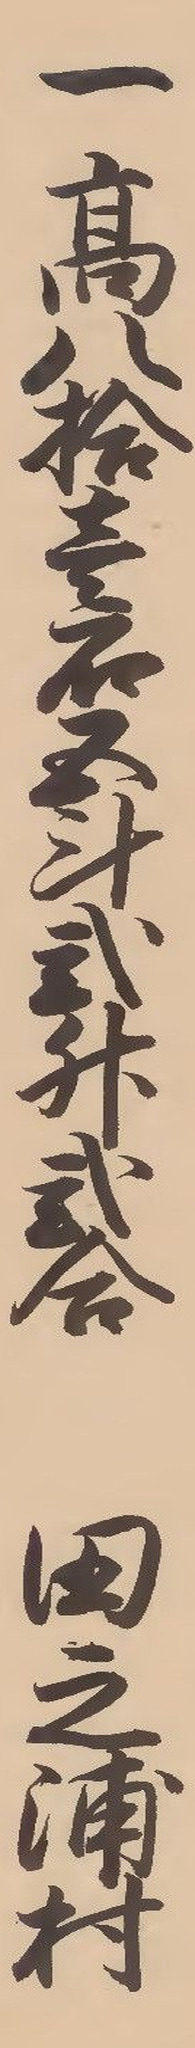一髙八拾壱石五斗弐升弐合田之浦村
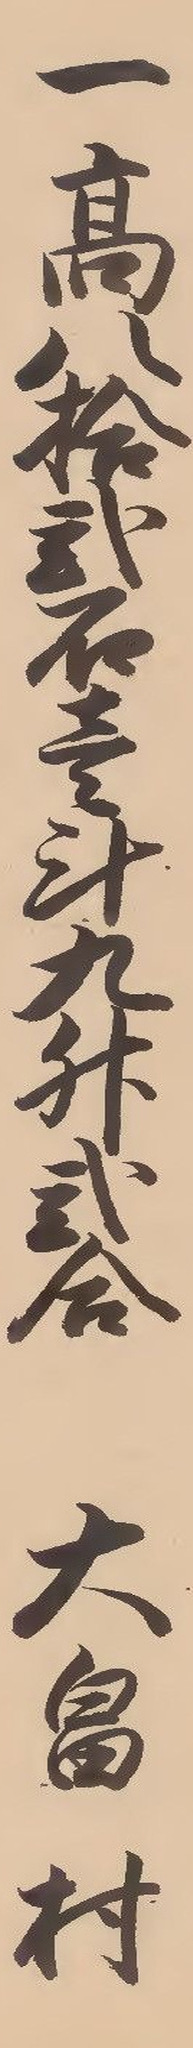一髙八拾弐石壱斗九升弐合大畠村
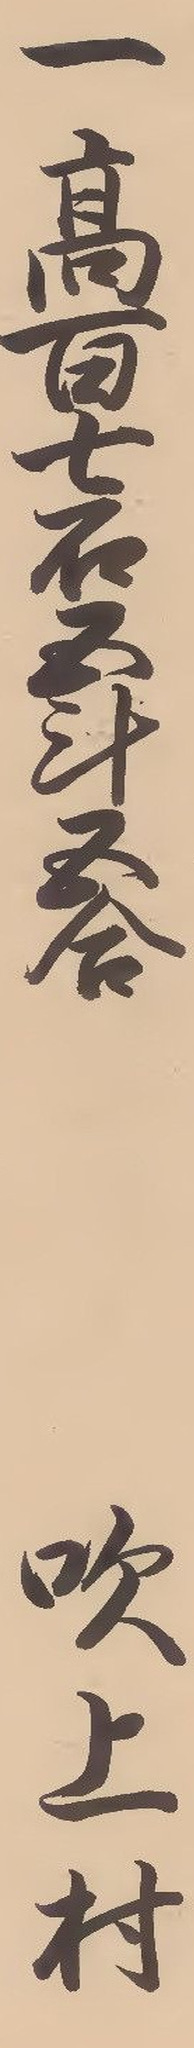一髙百七石五斗五合吹上村
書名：備前国郷帳
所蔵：国立公文書館 National Archives of Japan
